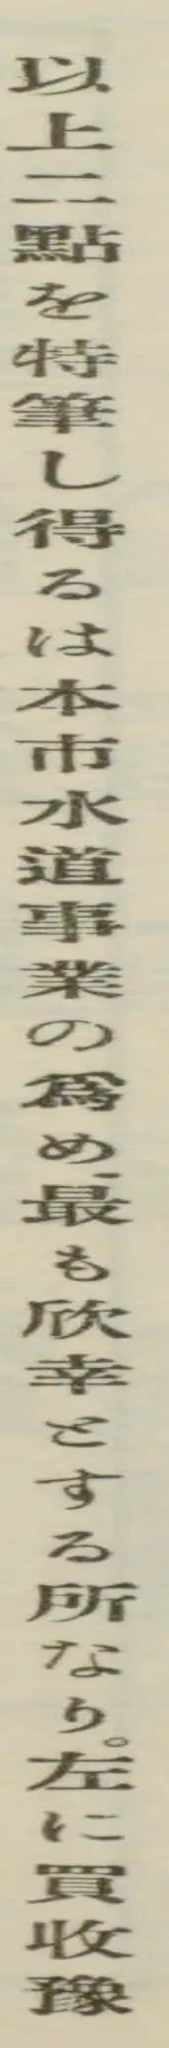以上二點を特筆し得るは本市水道事業の為め、最も欣幸とする所なり。左に買収予
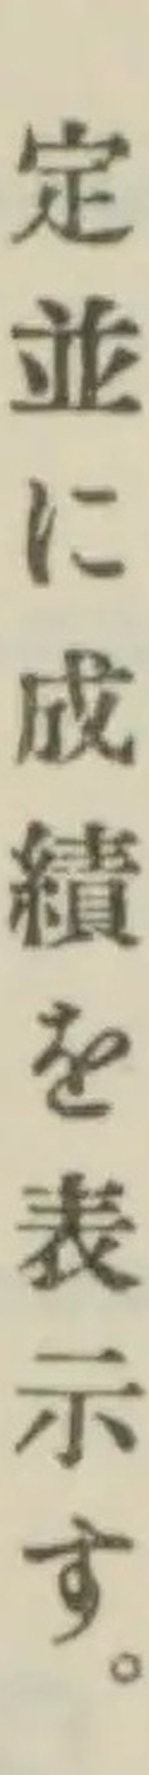定並に成績を表示す。
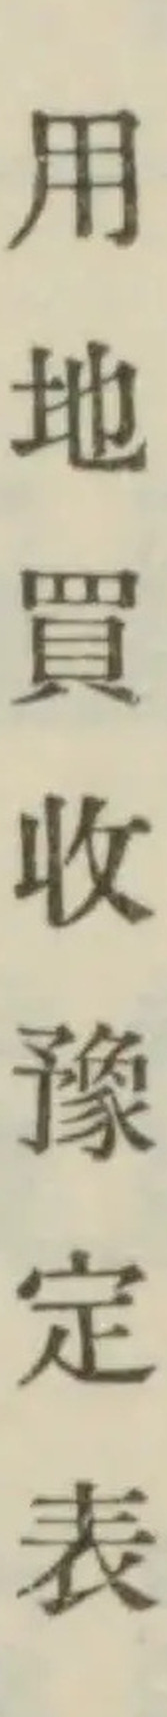用地買収予定表
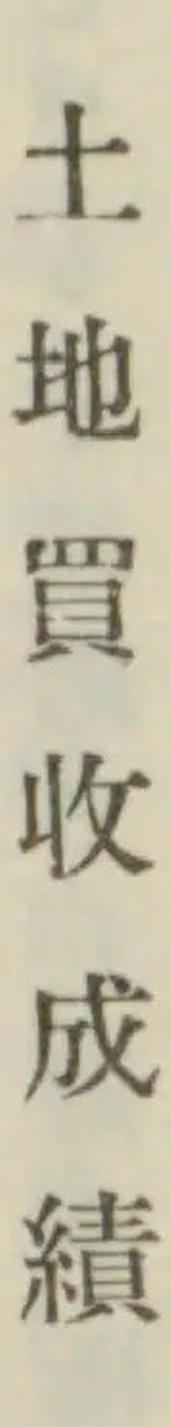土地買収成績

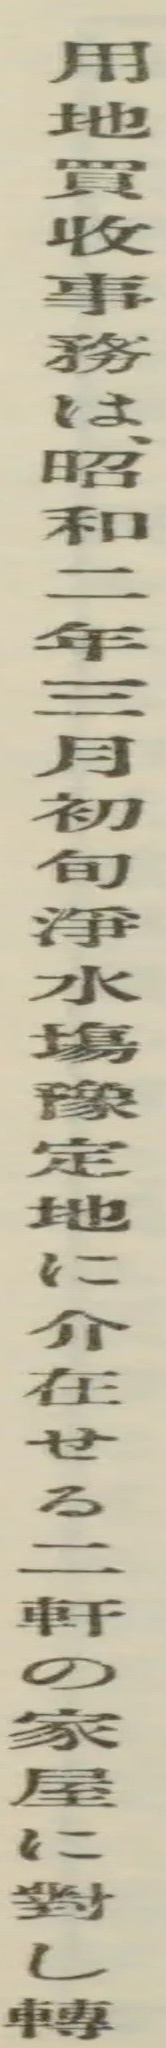用地買収事務は、昭和二年三月初旬浄水場用予定地に介在せる二軒の家屋に対し転
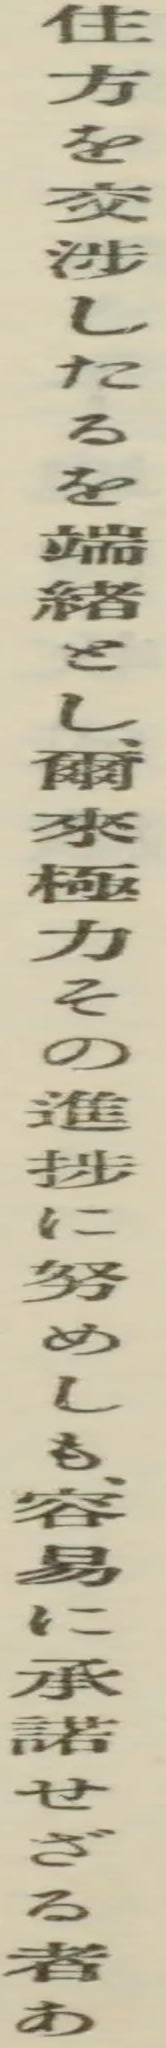住方を交渉したるを端緒とし、爾来極力その進捗に努めしも、容易に承諾せざる物あ
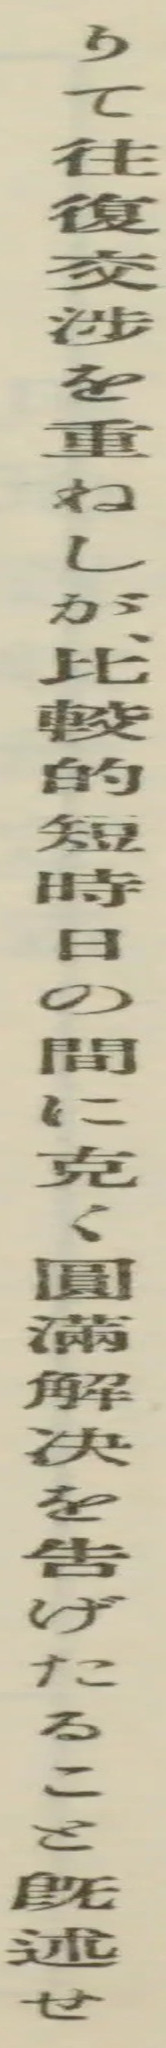りて往復交渉を重ねしが、比較的短時日の間に克く円満解決を告げたること既述せ
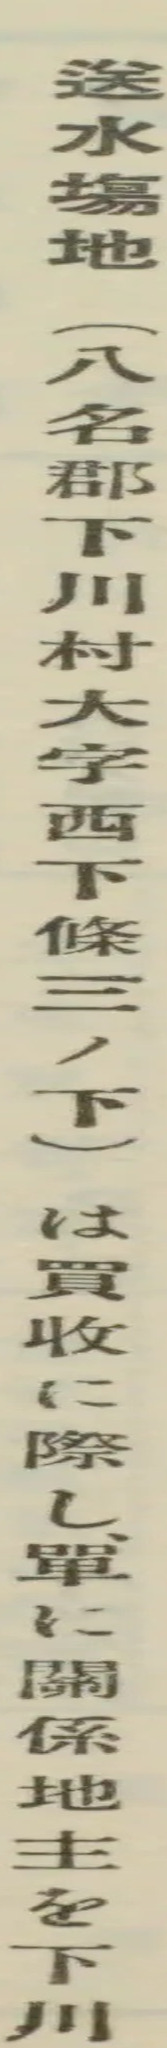送水場地(八名郡下川村大字西下條三ノ下)は買収に際し、単に関係地主を下川
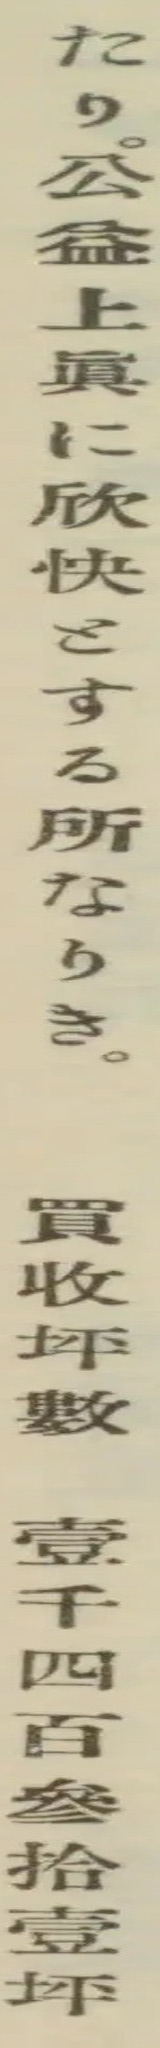たり。公益上真に欣快とする所なりき。買収坪数壹千四百參拾壹坪
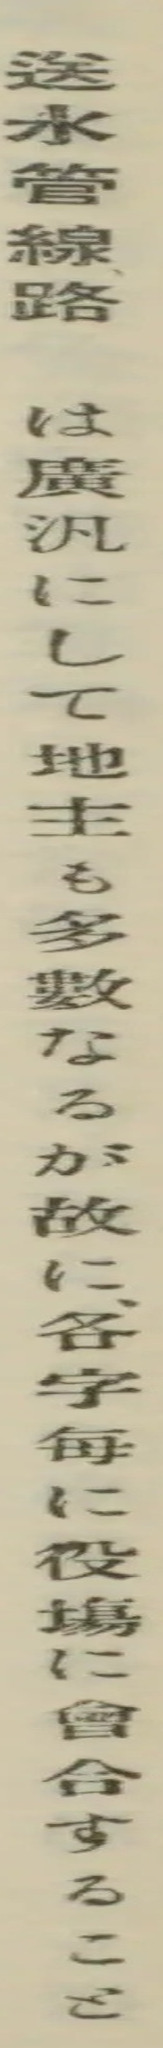送水管線路は広汎にして地主も多数なるが故に、各字毎に役場に会合すること
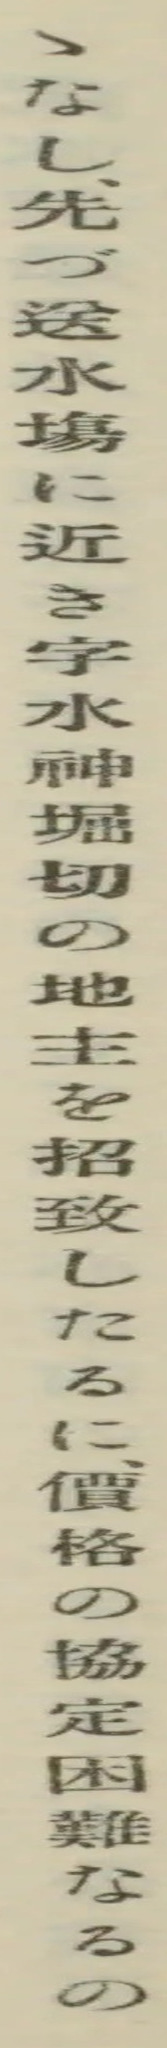ゝなし、先ず送水場に近き字水神堀切の地主を招致したるに、価格の協定困難なるの
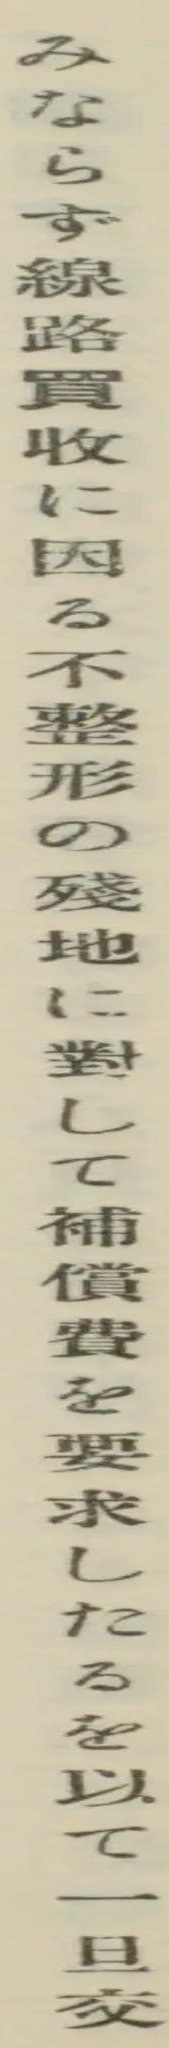みならず線路買収に因る不整形の残地に対して補償費を要求したるを以て一旦交
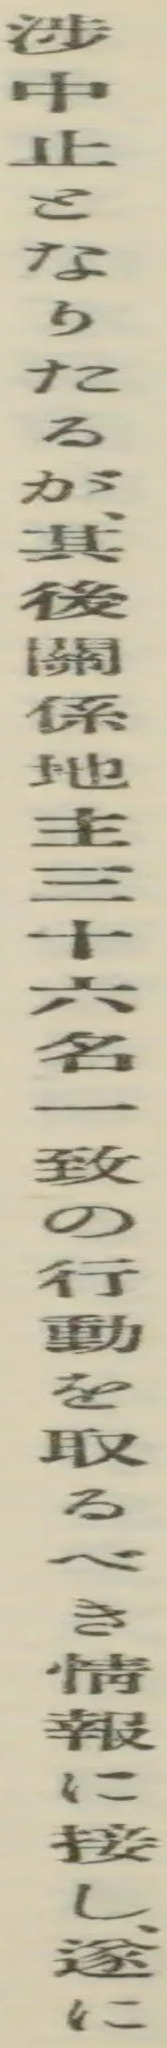渉中止となりたるが、其後関係地主三十六名一致の行動を取るべき情報に接し、遂に
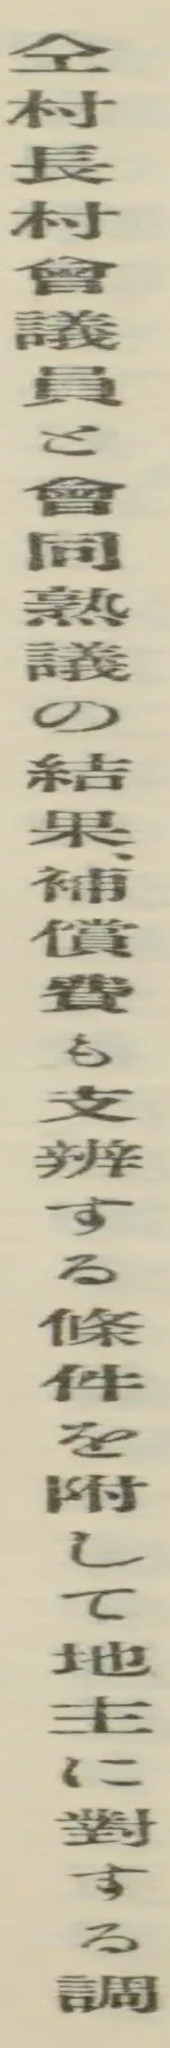同村長村会議員と会同熟議の結果、補償費も支辨する条件を附して地主に対するちょ調
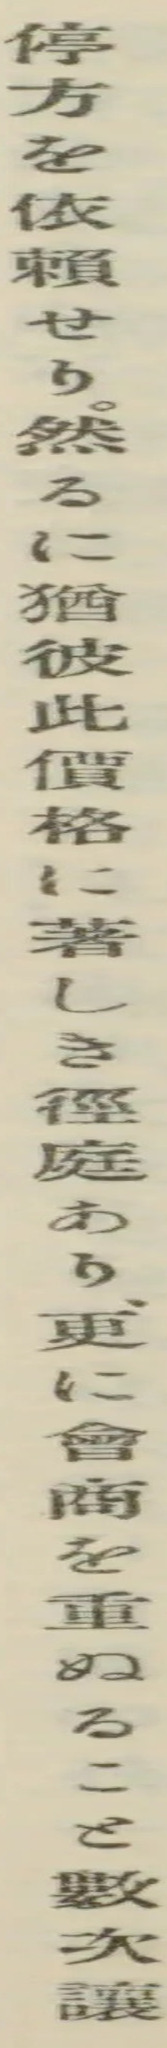停片を依頼せり。然るに猶彼此価格に著しき径庭あり、更に会商を重ぬること数次譲
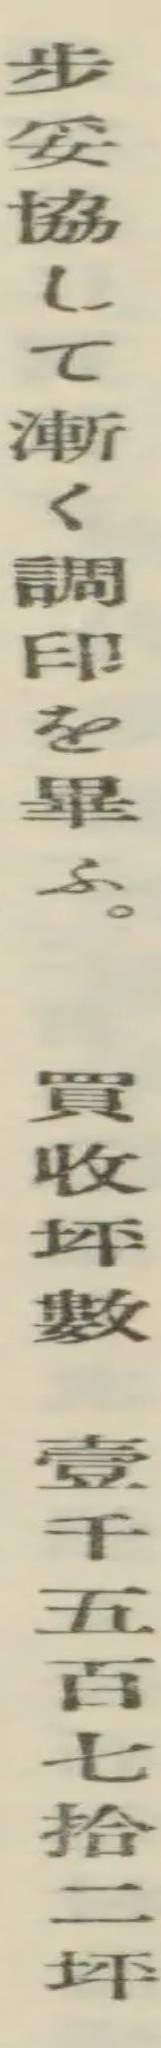歩妥協して漸く調印を畢ふ。買収つ坪数壹千五百七拾二坪
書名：豊橋市水道誌
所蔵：国立国会図書館 National Diet Library, JAPAN
